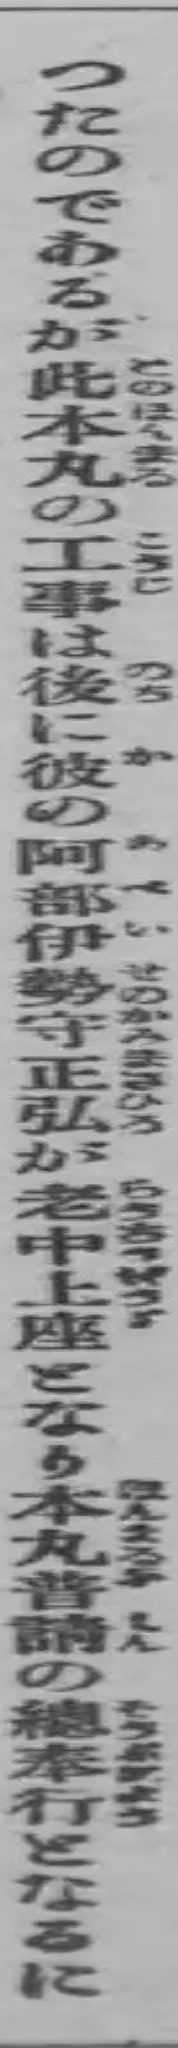つたのであるが此本丸の工事は後に彼の阿部伊勢守正弘が老中上座となり本丸普請の総奉行となるに
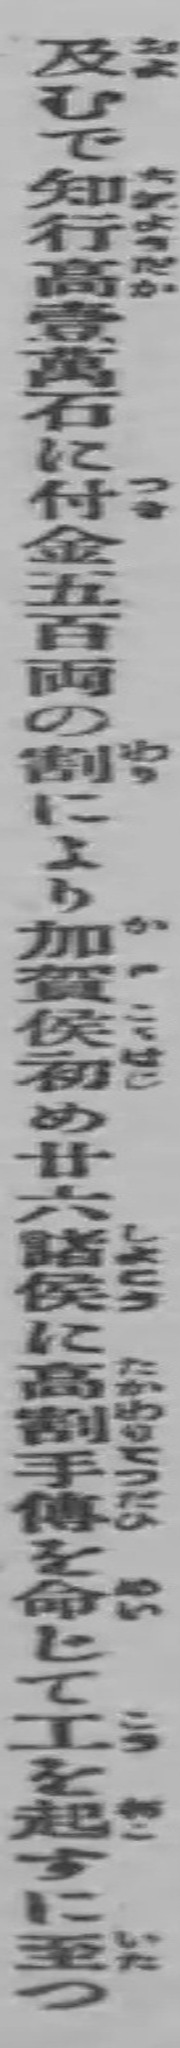及むで知行高壱万石に付金五百両の割により加賀侯初め廿六諸侯に高割手伝を命じて工を起すに至つ
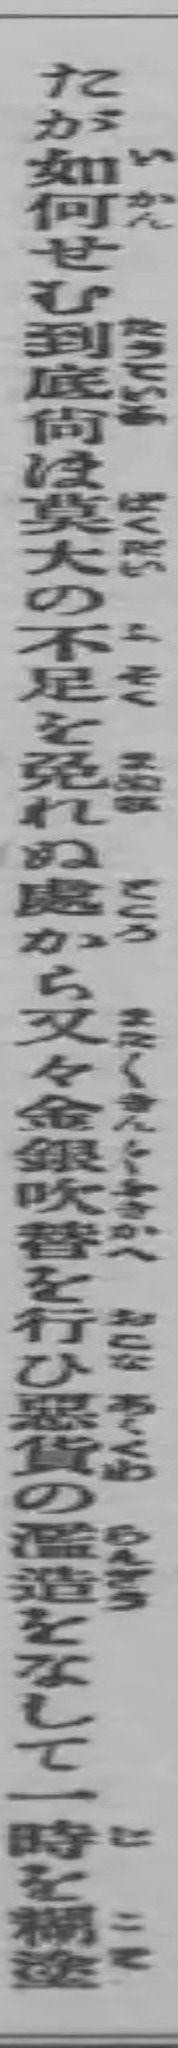たが如何せむ到底尚ほ莫大の不足を免れぬ処から又々金銀吹替を行ひ悪貨の濫造をなして一時を糊塗
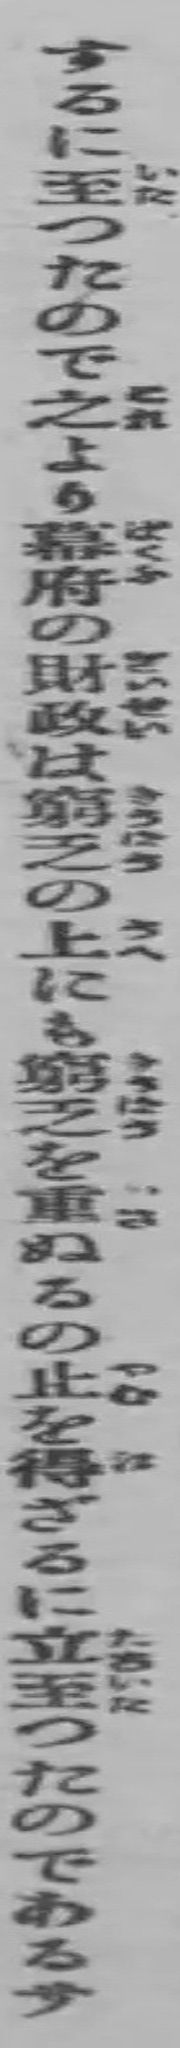するに至つたので之より幕府の財政は窮乏の上にも窮乏を重ぬるの止を得ざるに立至つたのであるサ
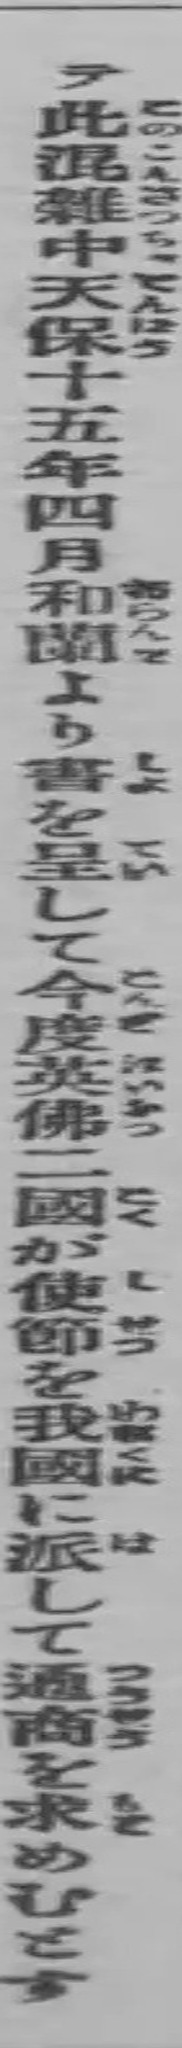テ此混雑中天保十五年四月和蘭より書を呈して今度英仏二国が使節を我国に派して通商を求めむとす
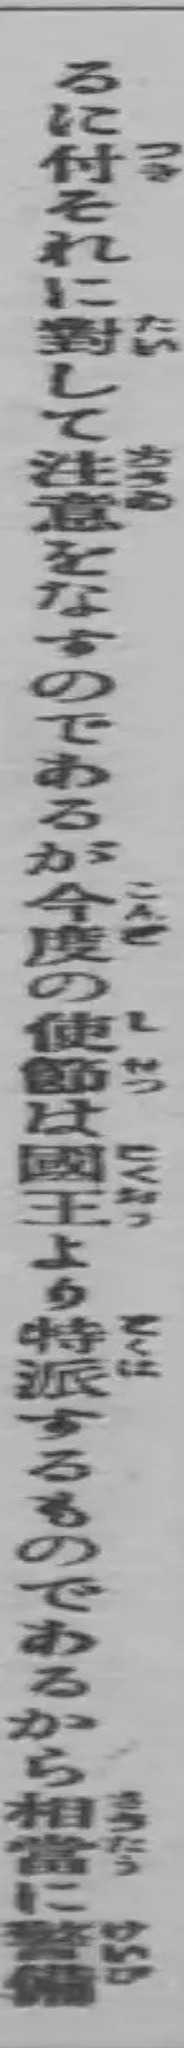るに付それに対して注意をなすのであるが今度の使節は国王より特派するものであるから相当に警備
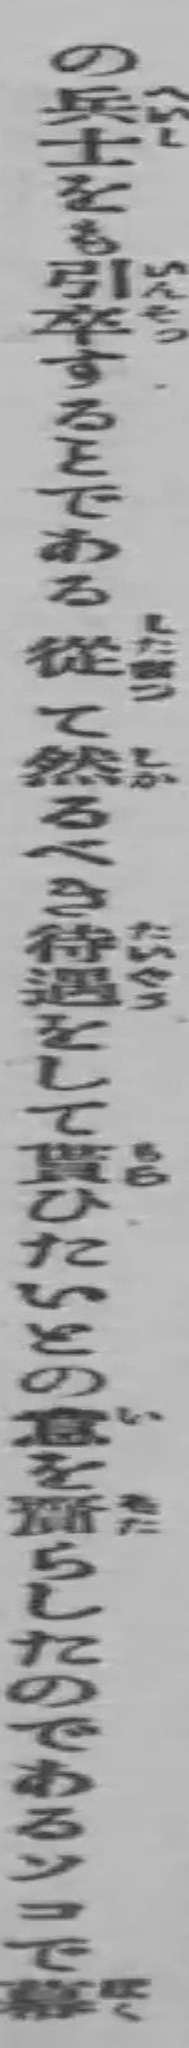の兵士をも引卒することである従て然るべき待遇をして貰ひたいとの意を齎らしたのであるソコで幕
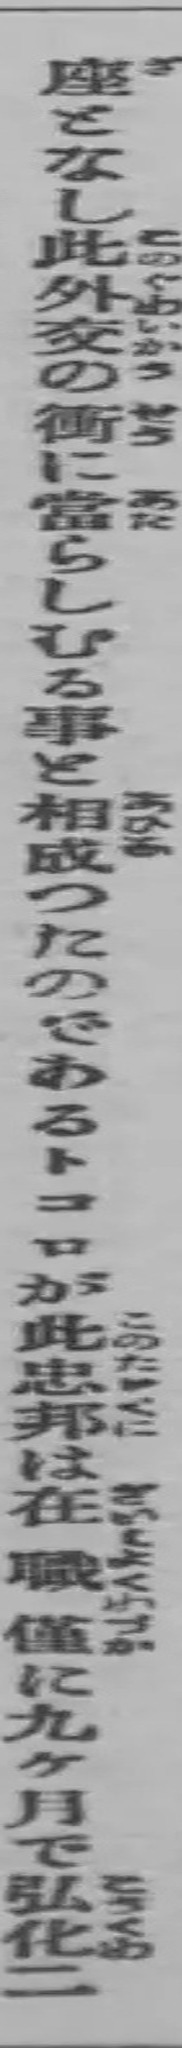座となし此外交の衝に当らしむる事と相成つたのであるトコロが此忠邦は在職僅に九ケ月で弘化二
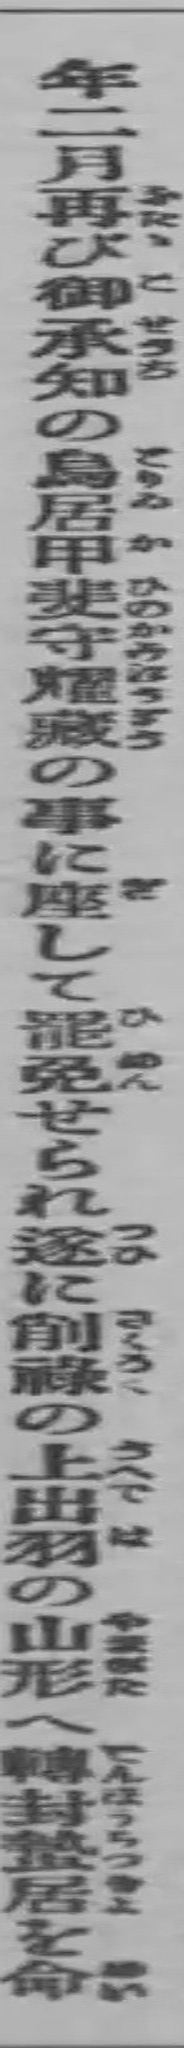年二月再び御承知の鳥居甲斐守耀蔵の事に座して罷免せられ遂に削禄の上出羽の山形へ転封蟄居を命
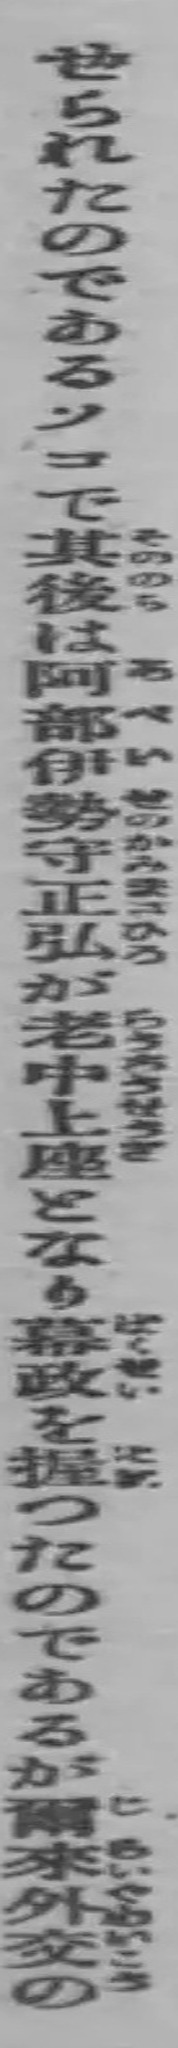ぜられたのであるソコで其後は阿部伊勢守正弘が老中上座となり幕政を握つたのであるが爾来外交の

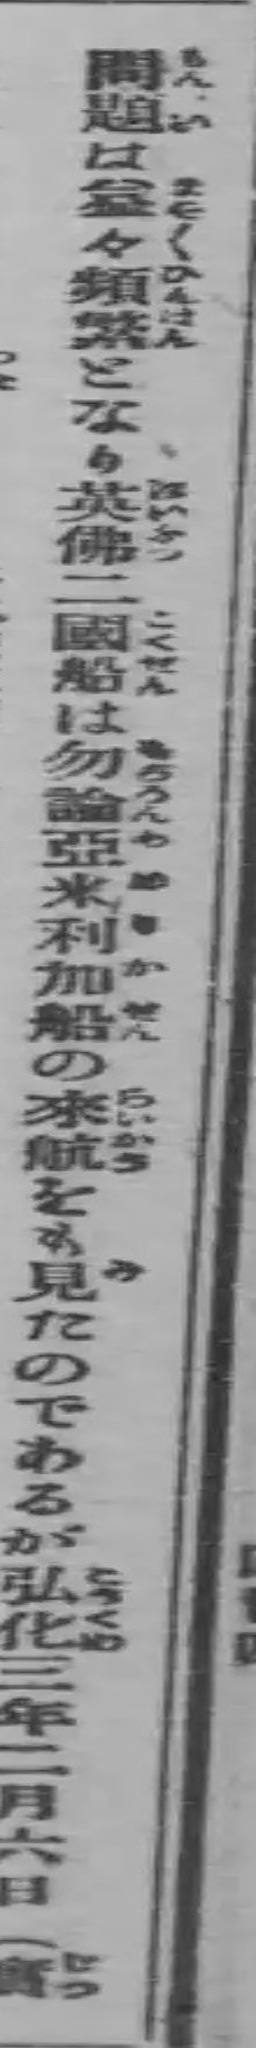問題は益々頻繁となり英仏二国船は勿論亜米利加船の来航をも見たのであるが弘化三年二月六日(実
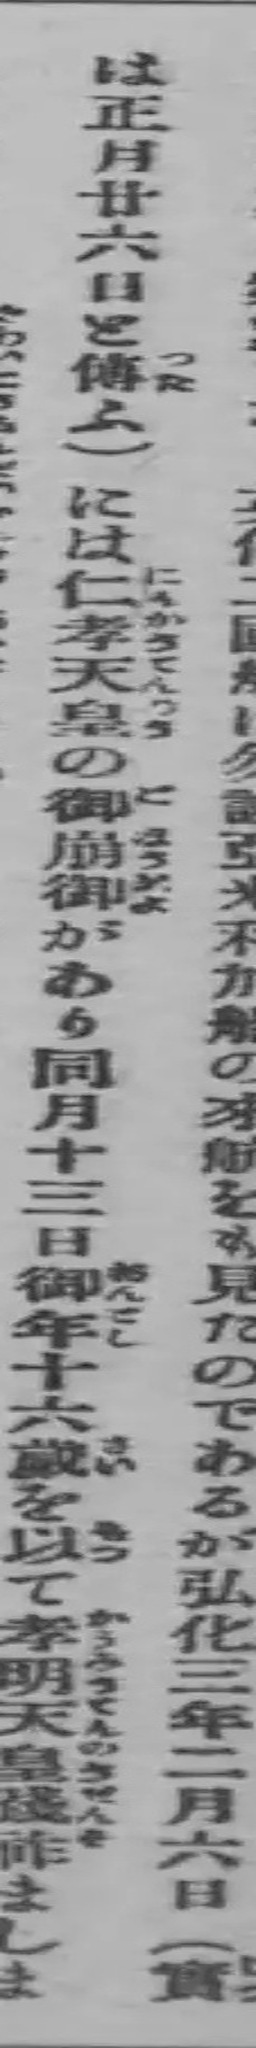は正月廿六日と伝ふ)には仁孝天皇の御崩御があり同月十三日御年十六歳を以て孝明天皇践祚ましま
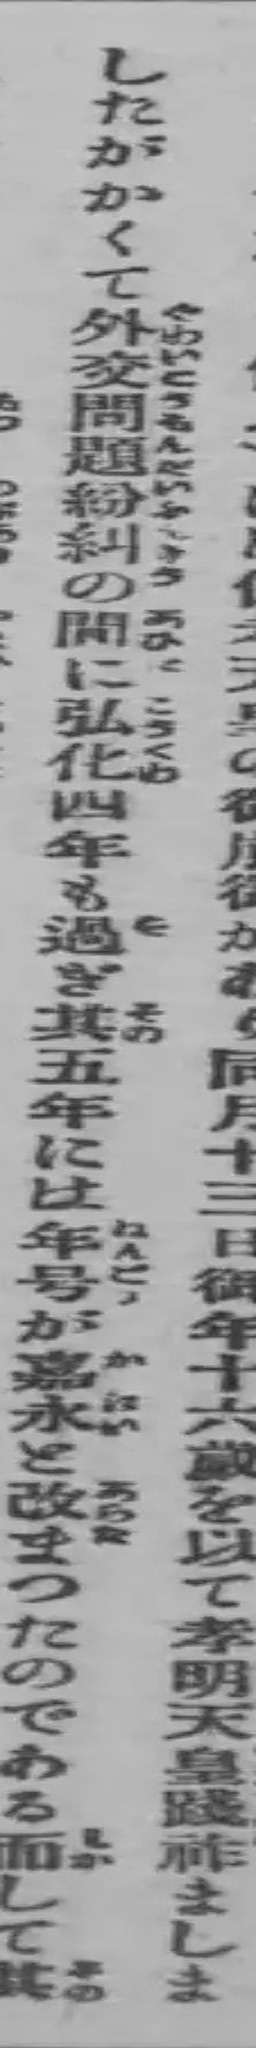したがかくて外交問題紛糾の間に弘化四年も過ぎ其五年には年号が嘉永と改まつたのである而して其
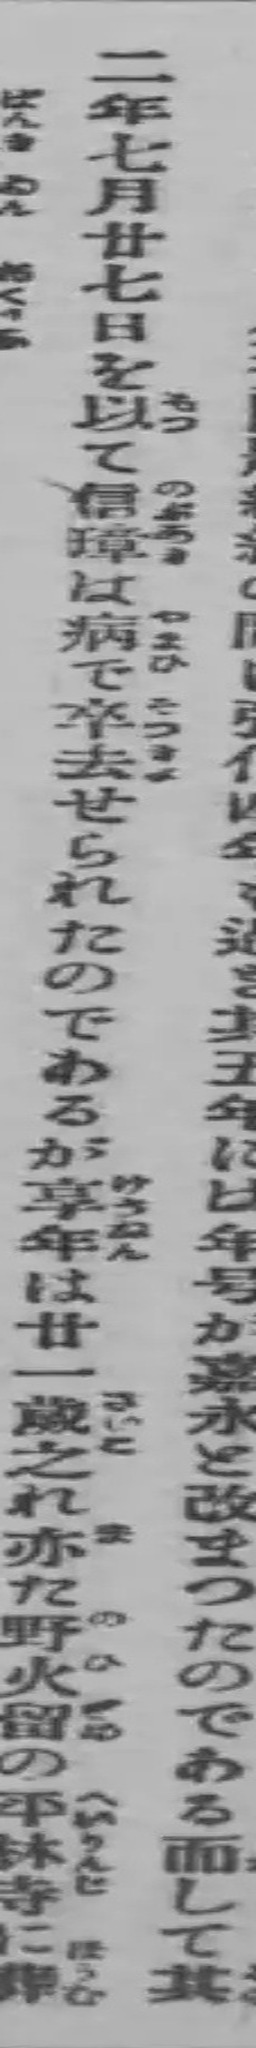信璋卒去二年七月廿七日を以て信璋は病で卒去せられたのであるが享年は廿一歳之れ亦た野火留の平林寺に葬
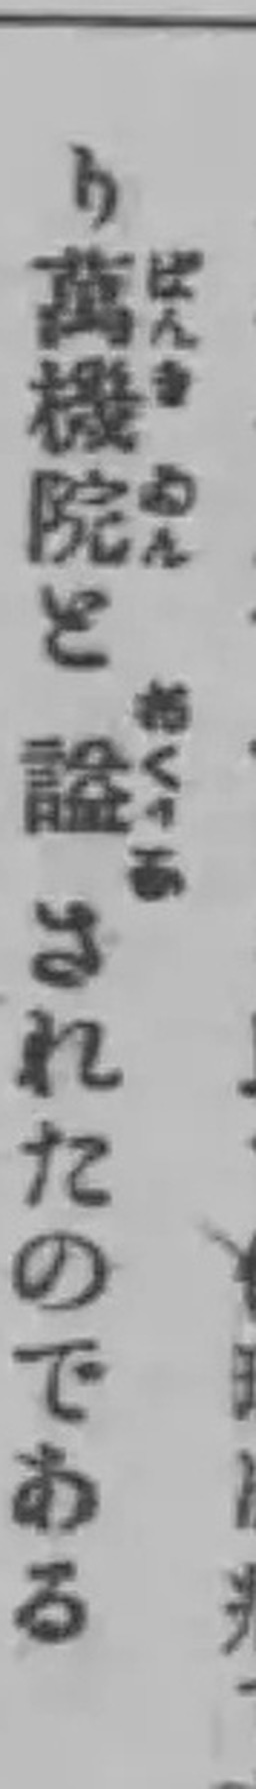り万機院と諡されたのである
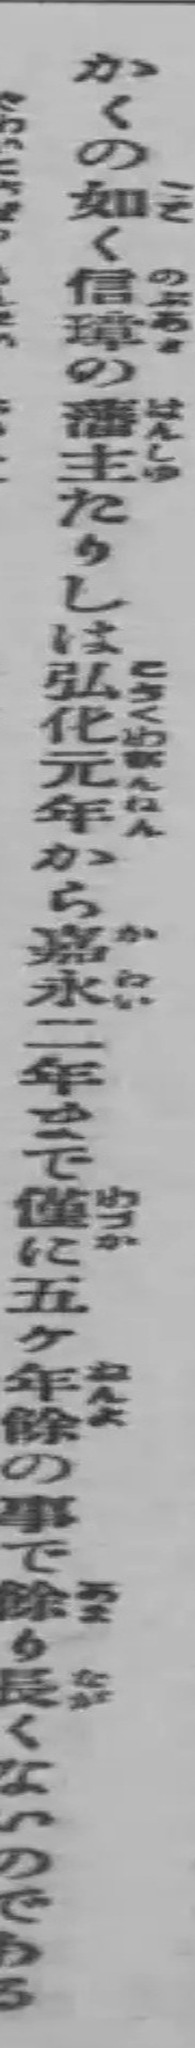かくの如く信璋の藩主たりしは弘化元年から嘉永二年まで僅に五ヶ年余の事で余り長くないのである
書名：豊橋市史談
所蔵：国立国会図書館 National Diet Library, JAPAN
